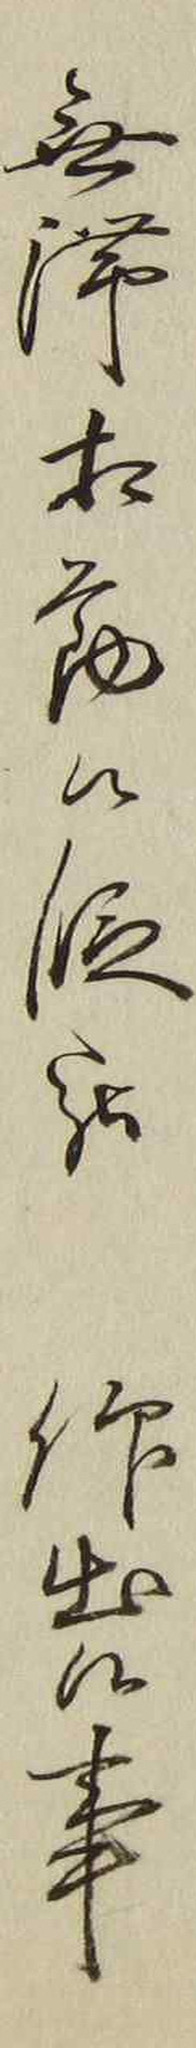無滞相勤候段被仰出候事
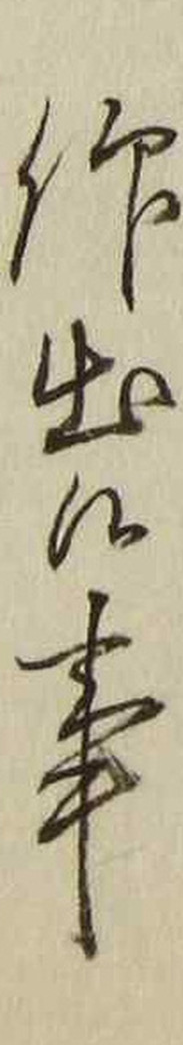仰付候事

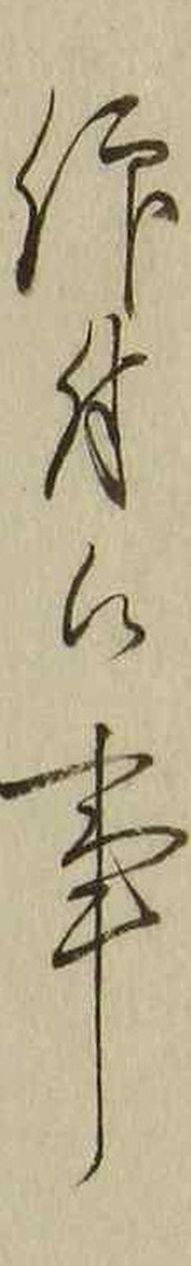仰付候事
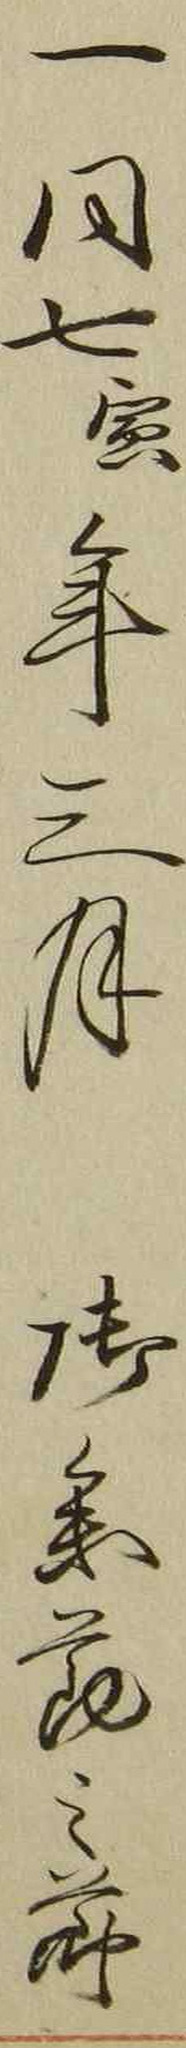一同七寅年三月御参勤之節
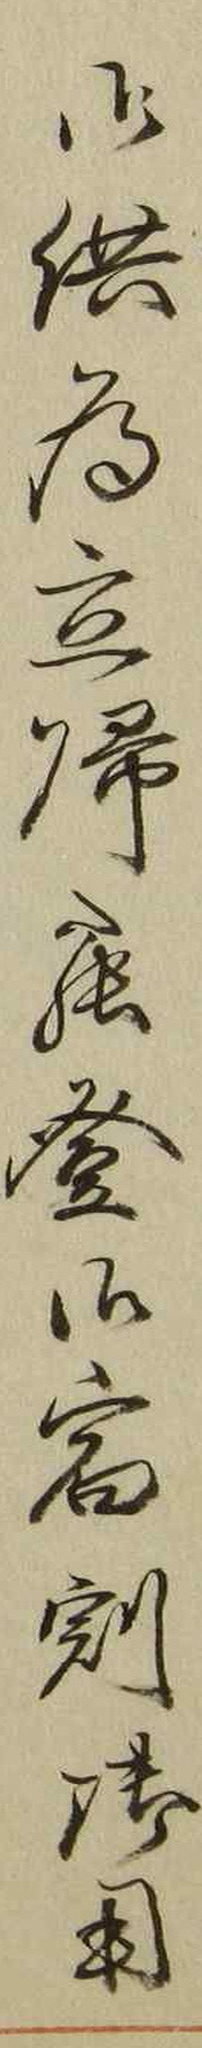御供為立帰罷登御宿割御用
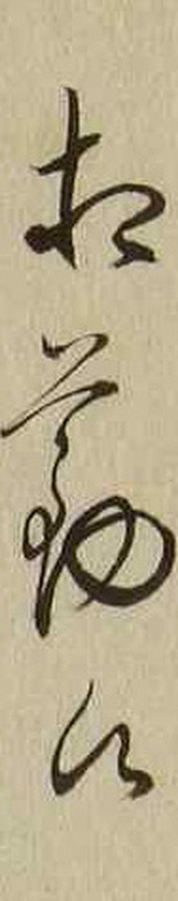相勤候
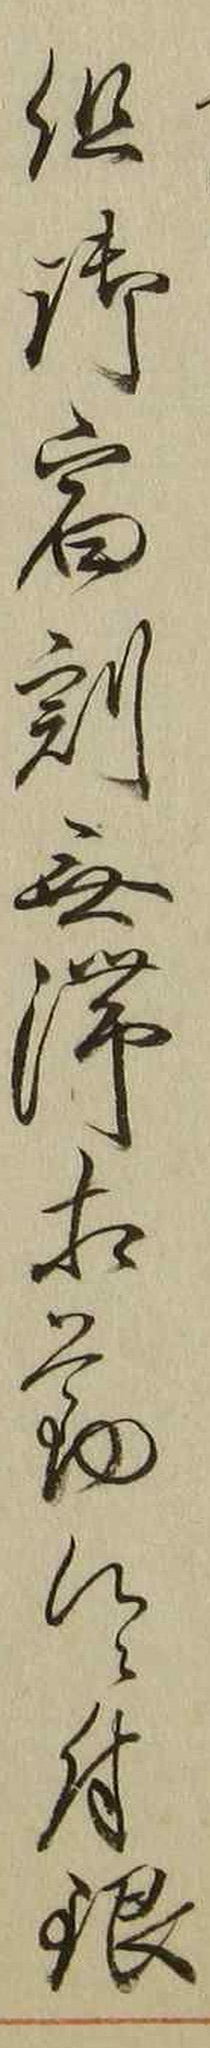但御宿割無滞相勤候ニ付銀
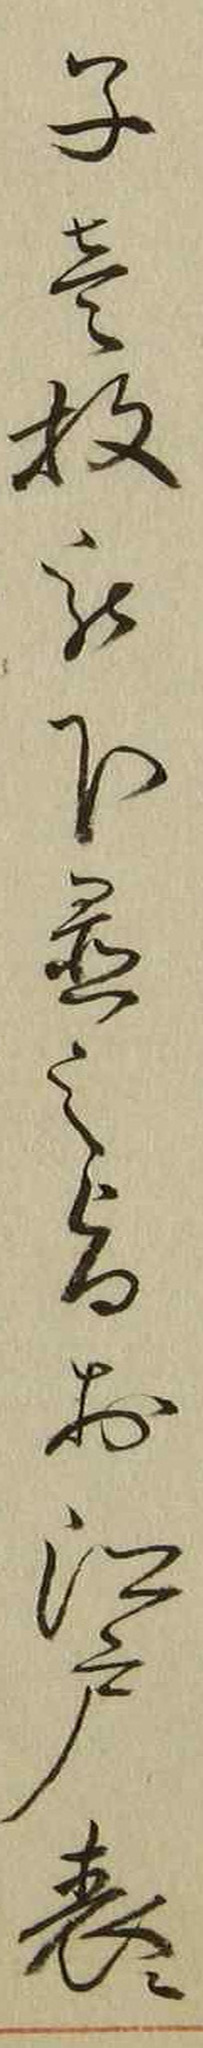子壱枚被下置之旨於江戸表ニ
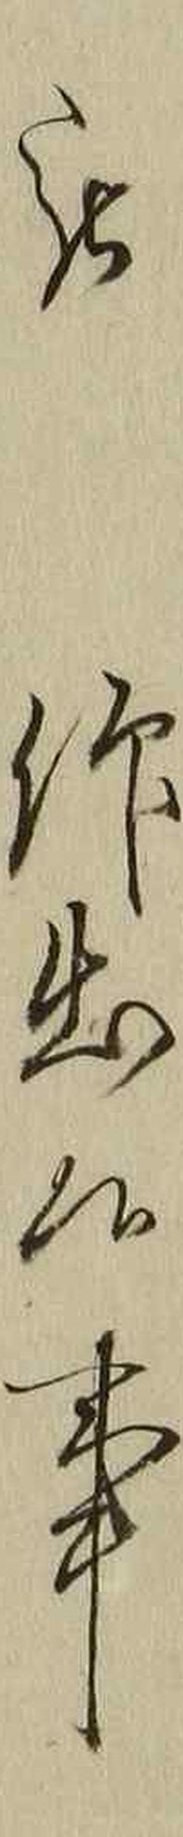被仰出候事
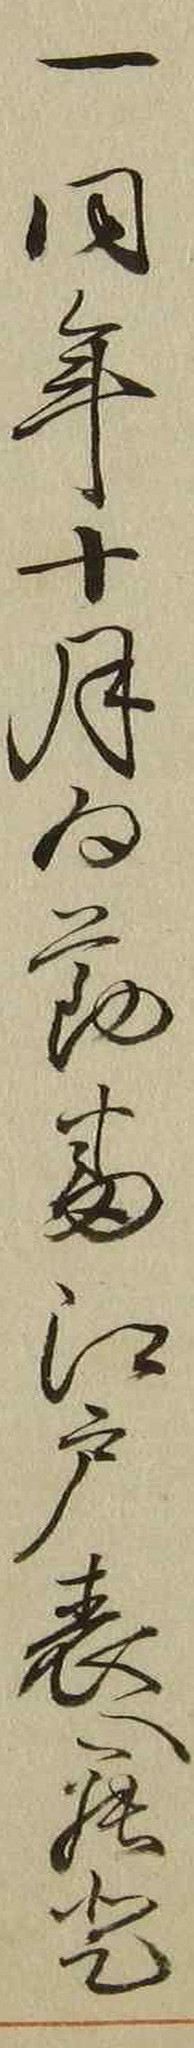一同年十月為勤番江戸表へ登
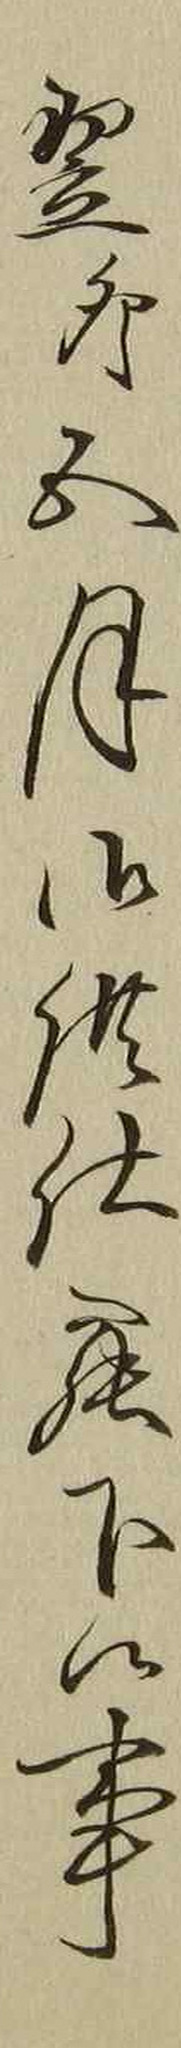翌卯五月御供仕罷下候事
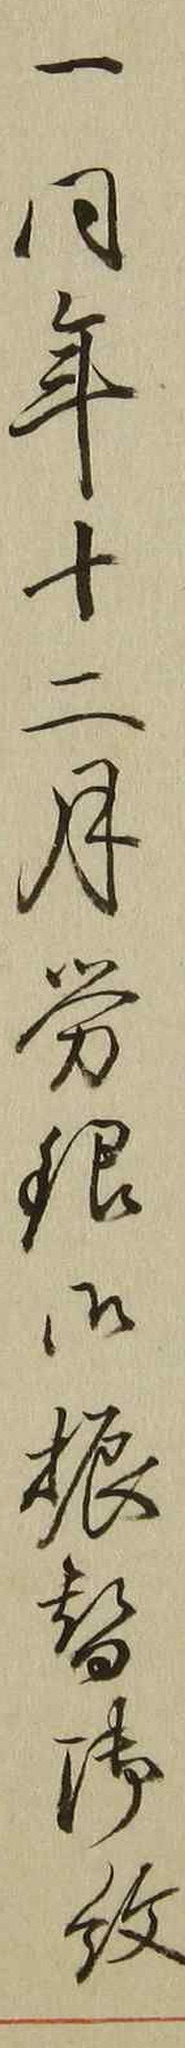一同年十二月労銀御振替御紋
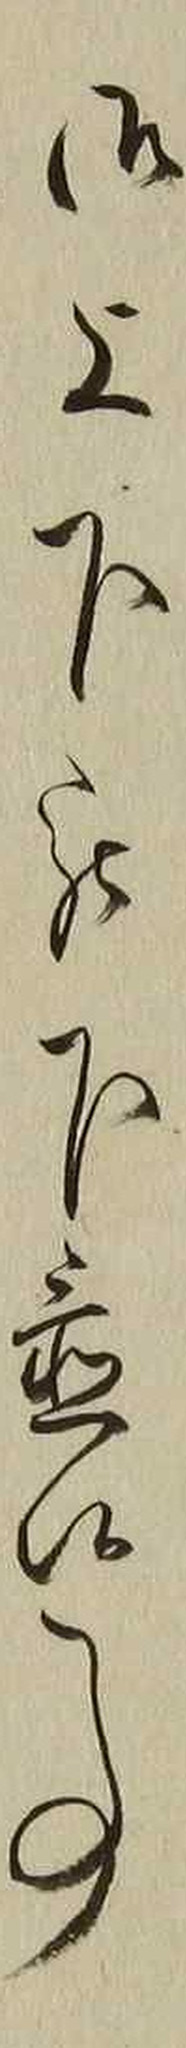御上下被下置候事
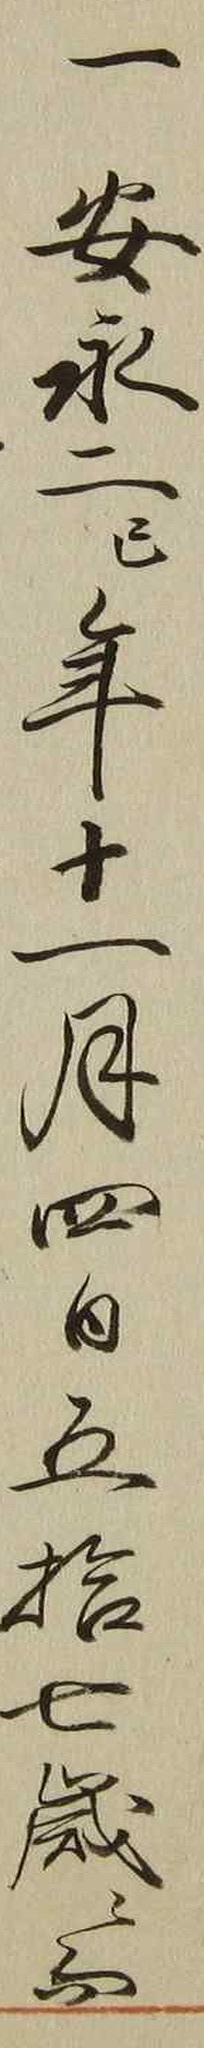一安永二巳年十一月四日五拾七歳ニ而
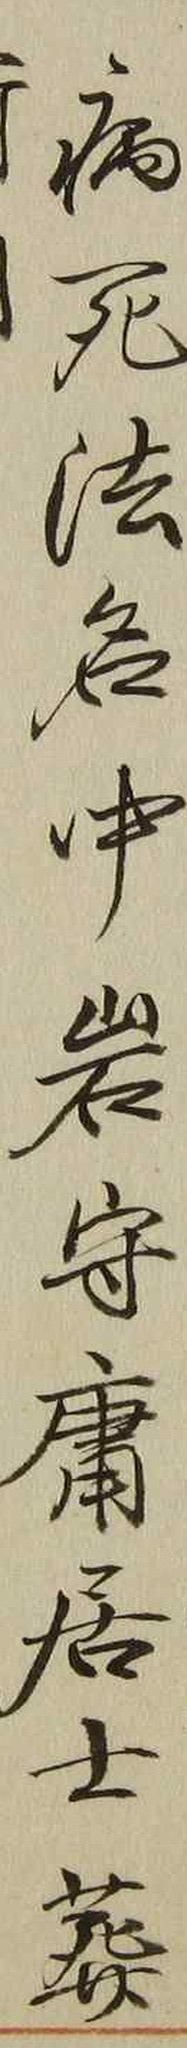病死法名中岩守庸居士葬
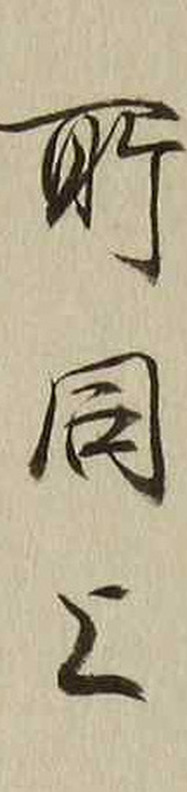所同上
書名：諸士系譜　巻之54　ほ之部1
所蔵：会津若松市立会津図書館
